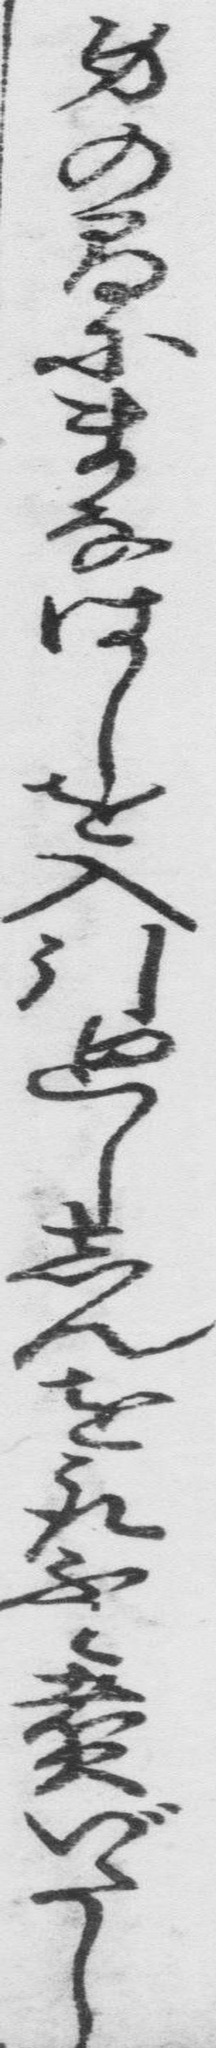身の間尓まるはしを入引廻し志んを取ふく煮いたし

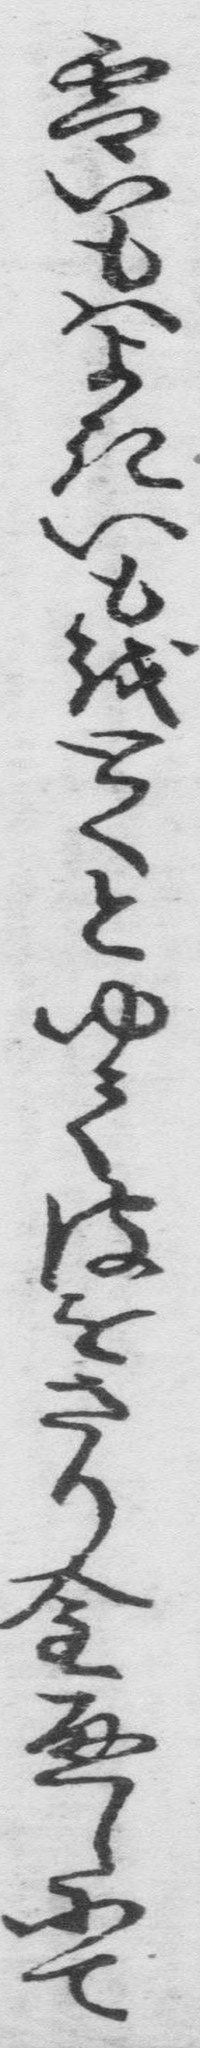雪いもはよ起いも越とくとゆて皮をさり全通し尓て
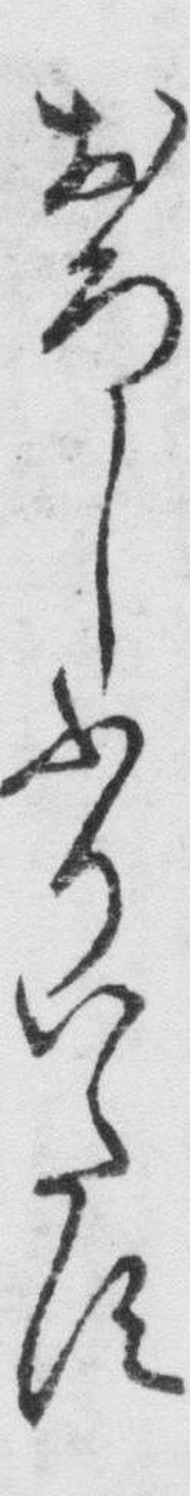おろしふりいた須
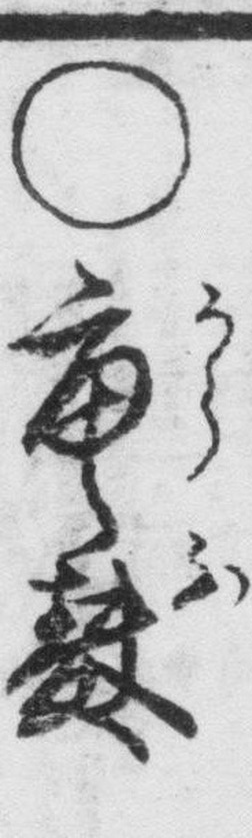〇唐麩
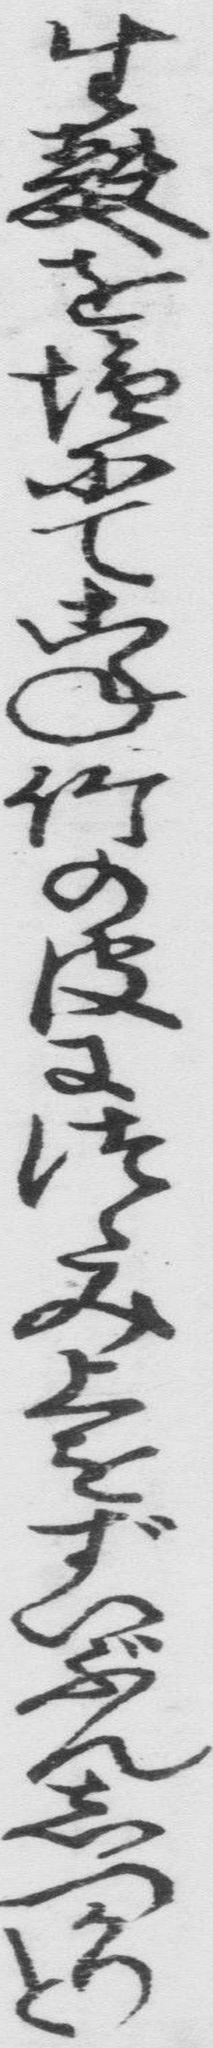生麩を塩尓て古年竹の皮尓徒々み上をずいぶん志つかりと
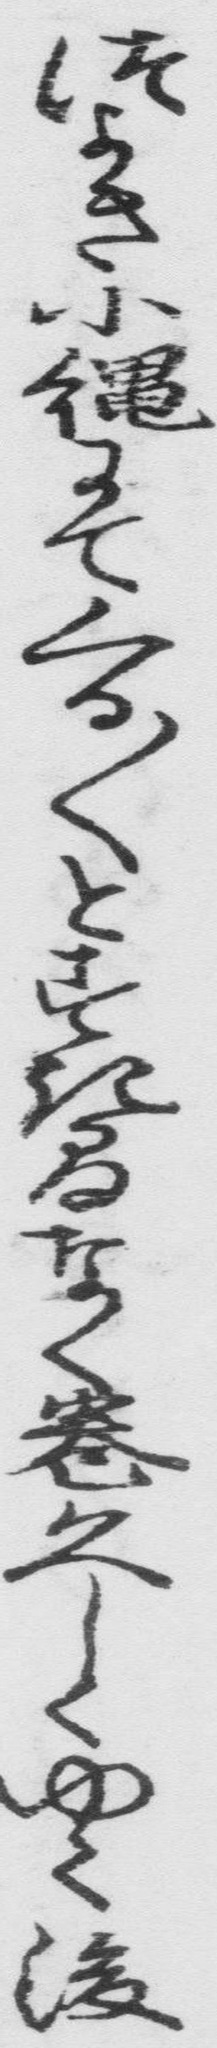徒よき小縄尓てくる〳〵と春起間なく巻久しくゆて後
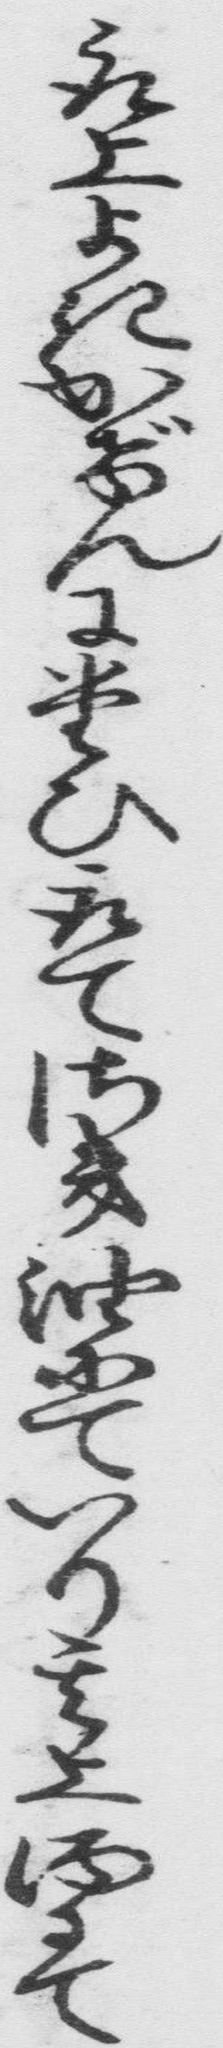取上よ起かげん尓堂ひ取て佐幾油尓ていり其上酒尓て
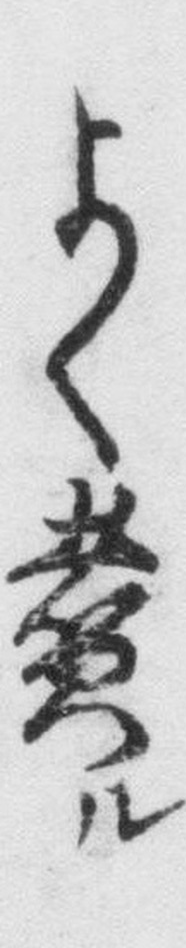よく煮る
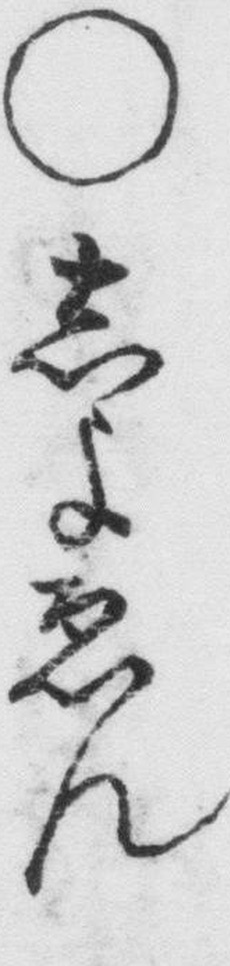〇志よゑん
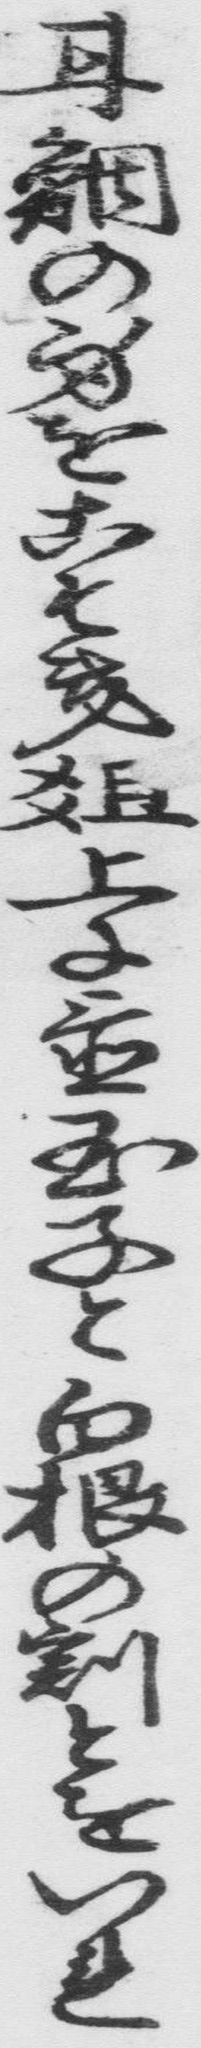甘鯛の身を古そ幾爼上尓置玉子と白根の割とをい連
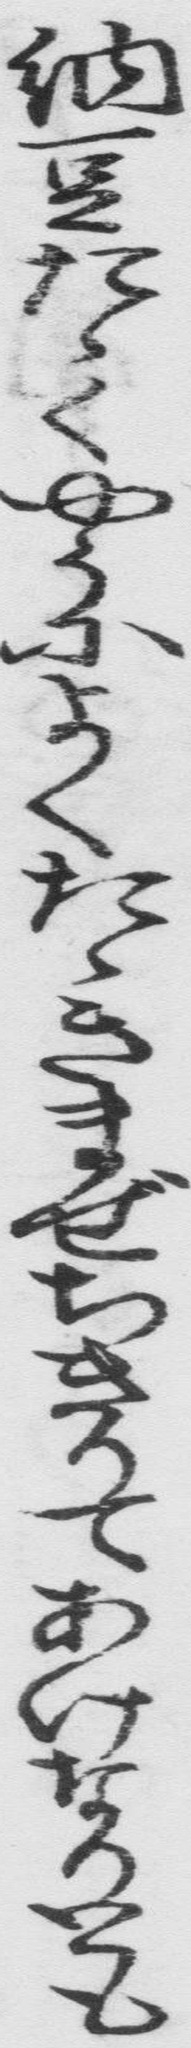納豆たゝくやう尓よくたゝきまぜちきりてあけなりとも
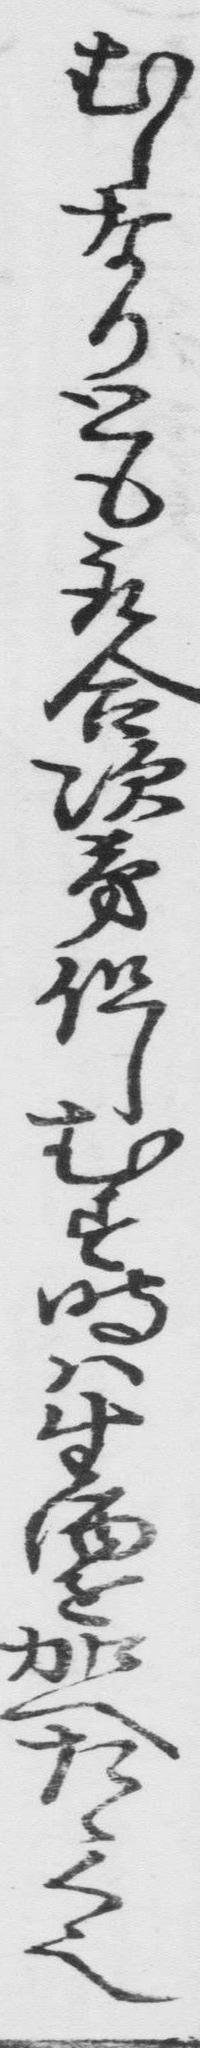むしなりとも取合次第但しむ春時は生酒を加へたゝく也
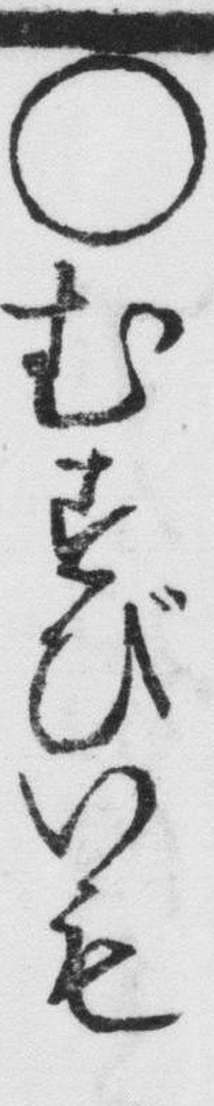〇む春びいも
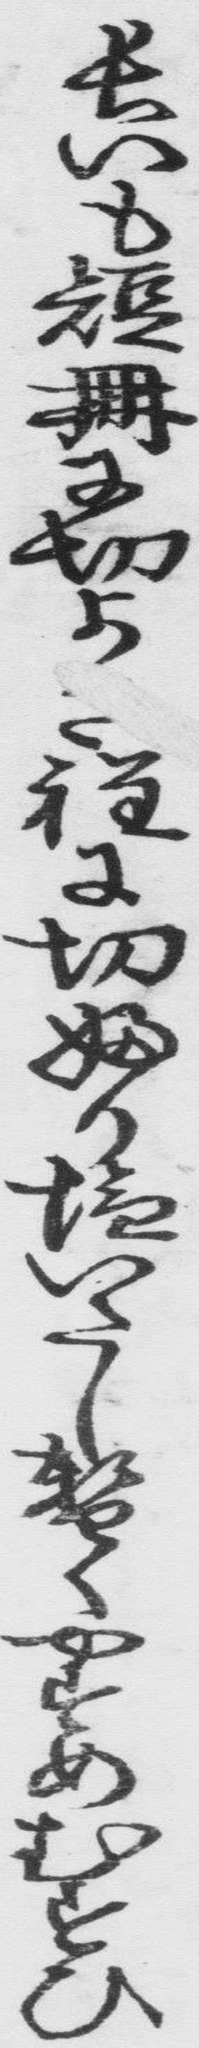長いも短冊尓切よき程尓切婦り塩いたし暫くや春めむ春ひ
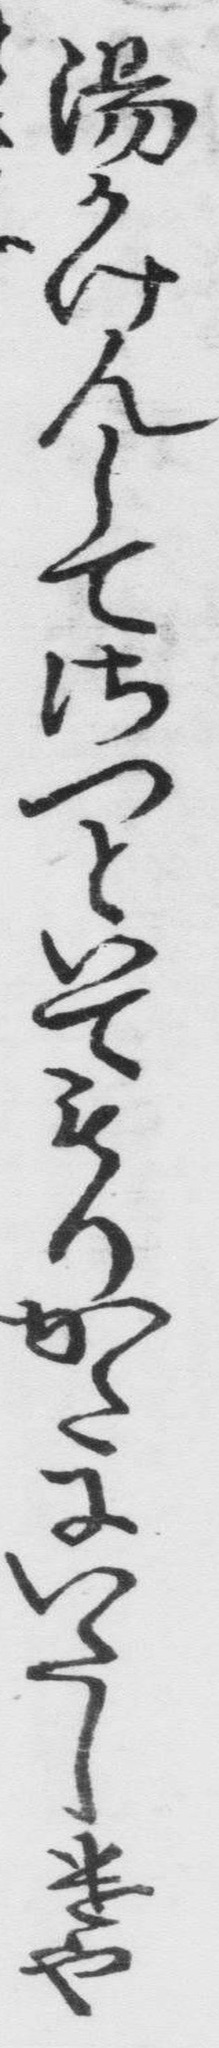湯かけんして佐つといてもりかた尓いたし遣也
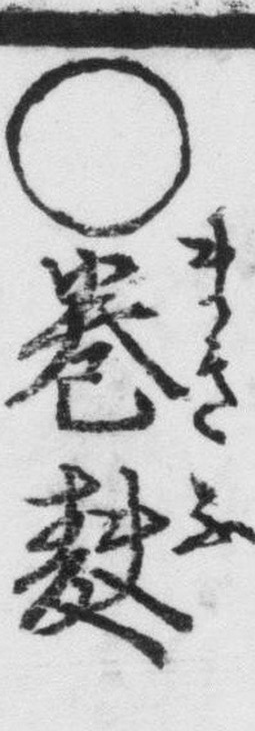〇巻麩
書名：普茶料理抄
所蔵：大阪府立大学学術情報センター 国文学研究資料館
